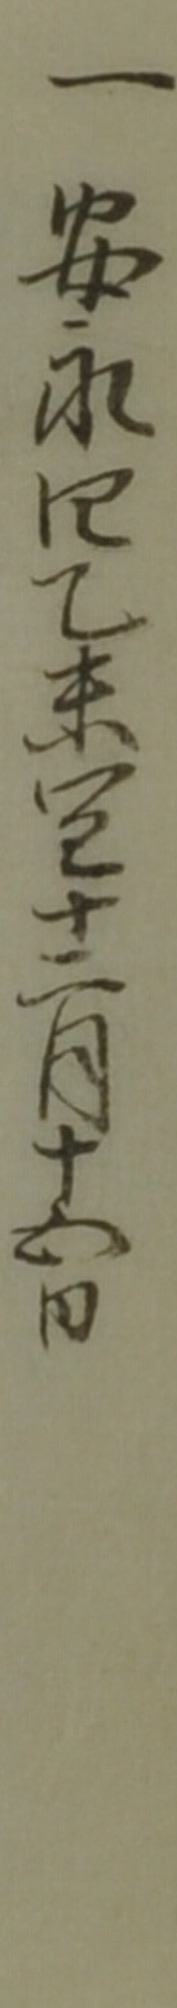一安永四乙未閏十二月十五日
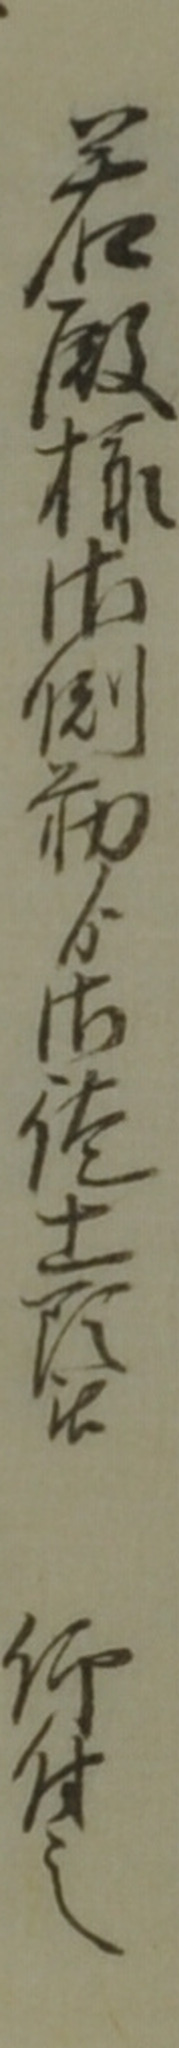若殿様御側勤ゟ御徒士頭被仰付之
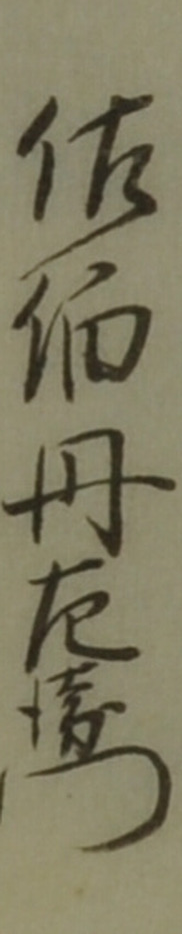佐伯丹左衛門
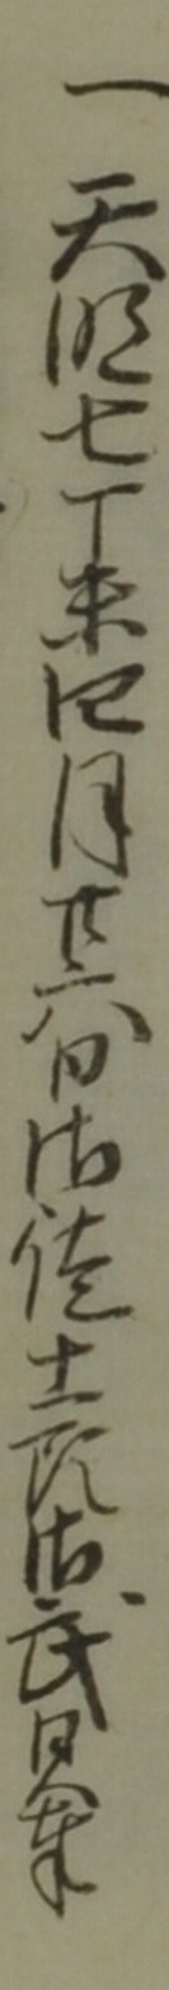一天明七丁未四月廿六日御徒士頭御武具奉
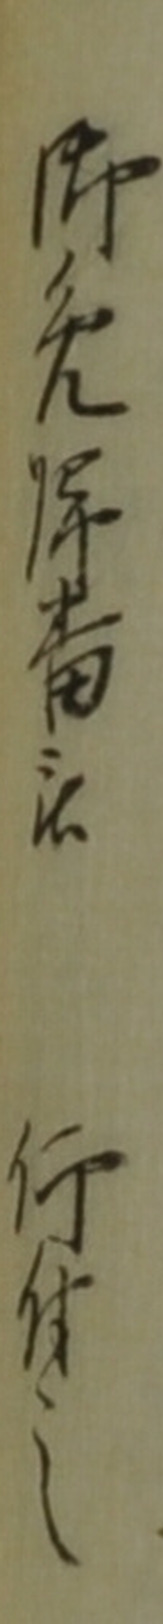御免帰番被仰付之
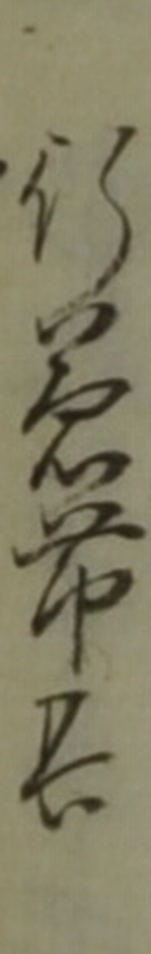行兼帯共
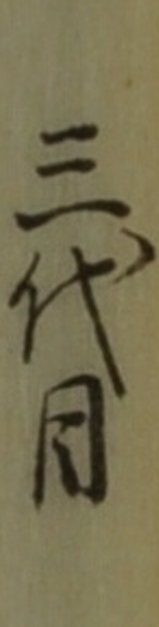三代目
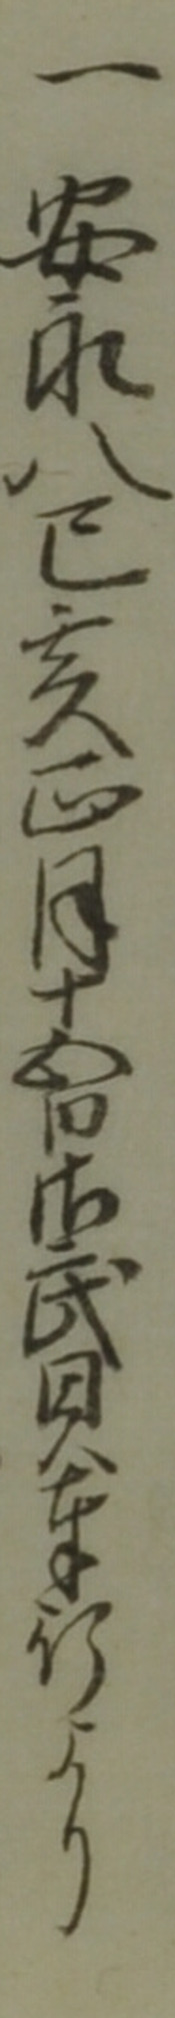一安永八己亥正月十五日御武具奉行より
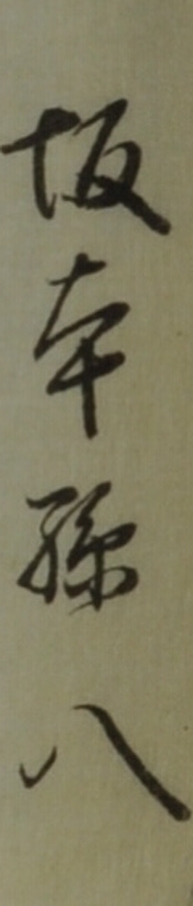坂本孫八
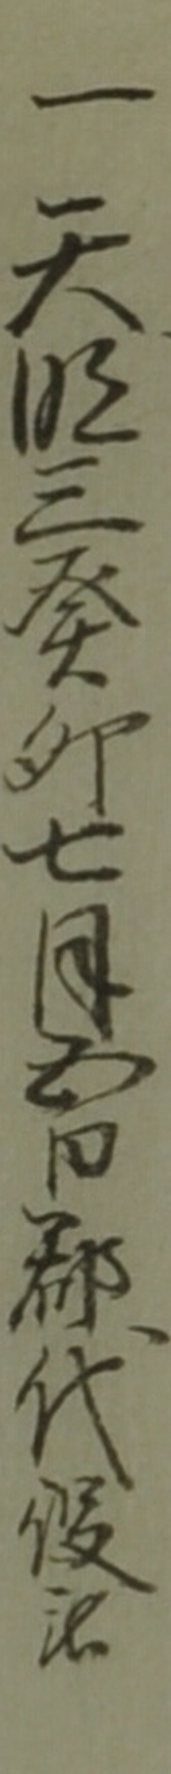一天明三癸卯七月五日郡代役被
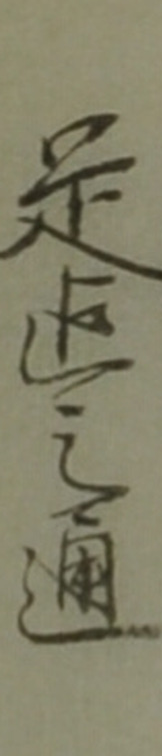是迄之通
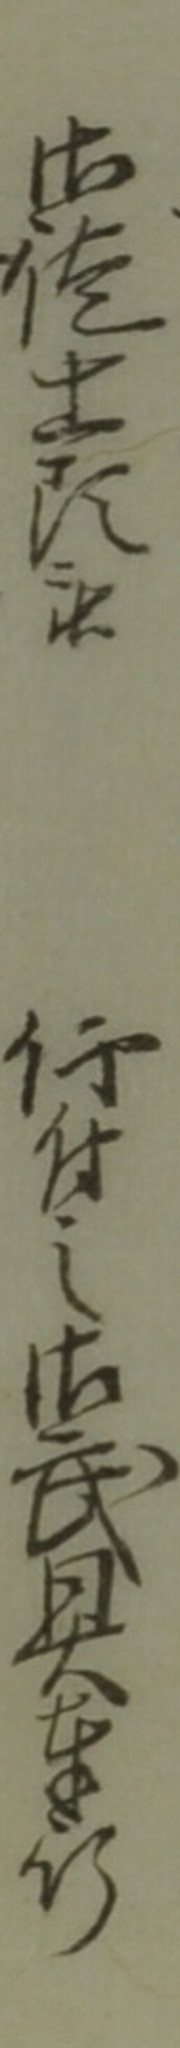御徒士頭被仰付之御武具奉行
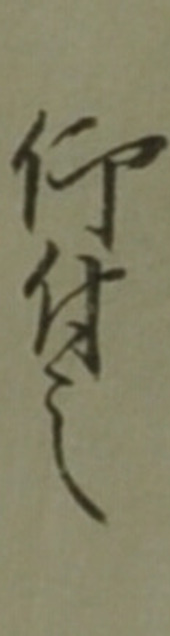仰付之
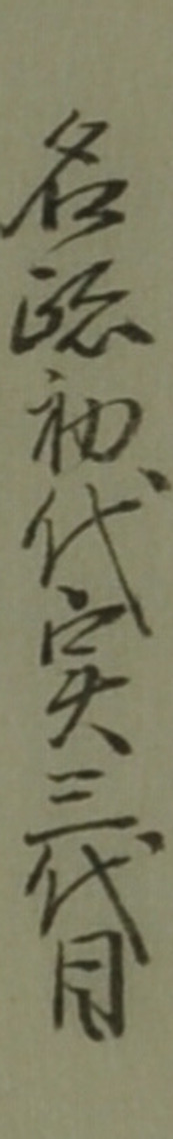名跡初代実三代目
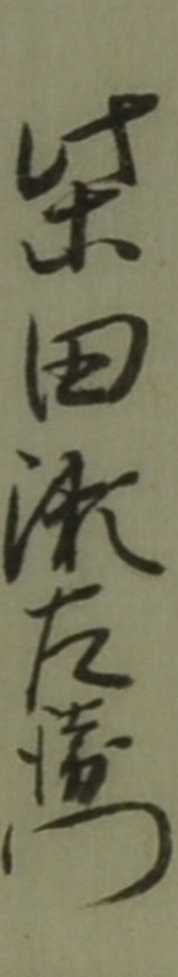柴田瀬左衛門
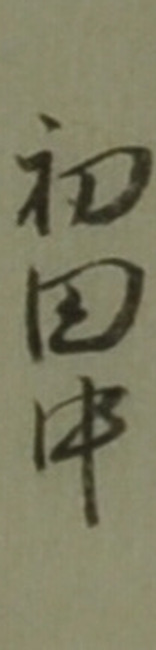初田中
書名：諸御役代々録（六）
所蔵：伊那市立高遠町図書館・合同会社AMANE
